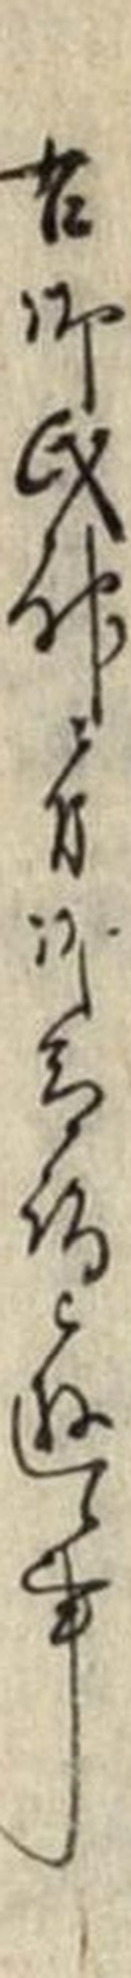右御氏神に付御参詣被遊候事
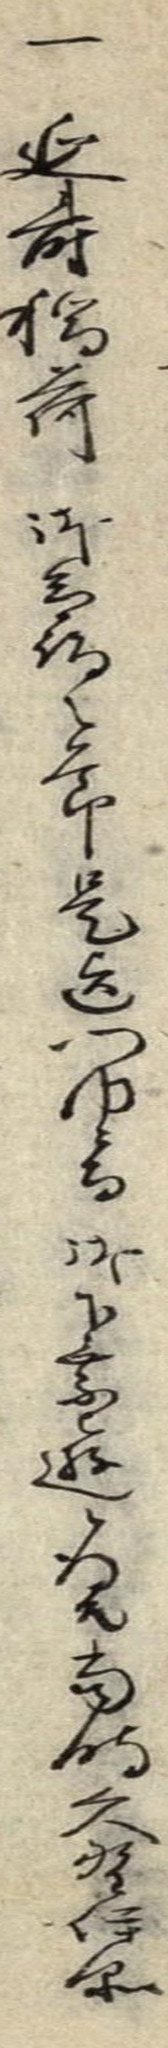一延寿稲荷御参詣之節是迄門内にて御下乗被遊候得共当時久野侍衛
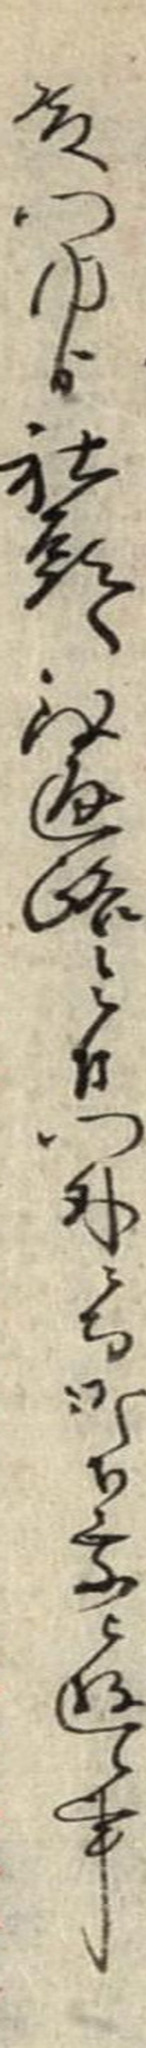殿門内ゟ社頭へ致通路候に付門外にて御下乗被遊候事
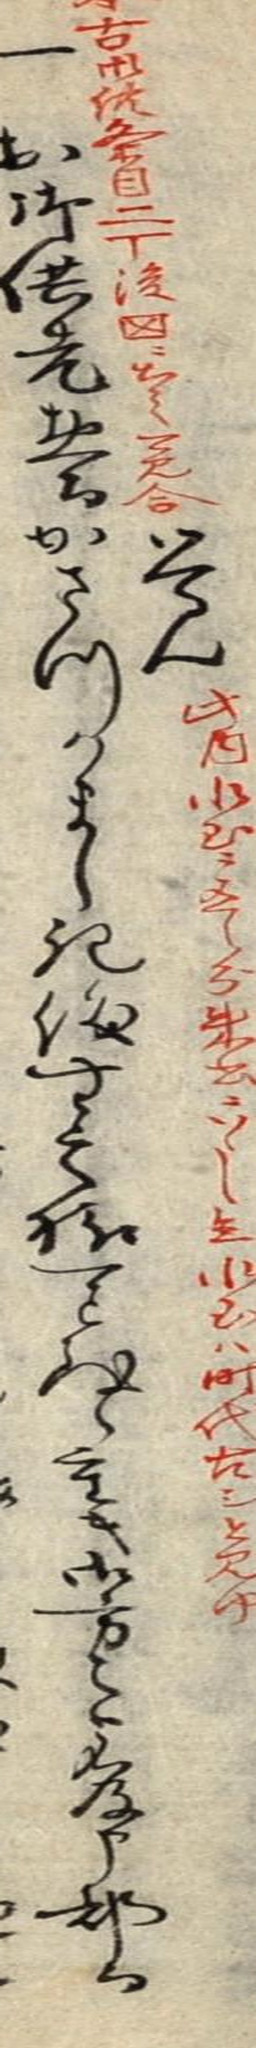一於御供先惣てかさつかましき儀無之様可被致候重き御方々は不及申都て
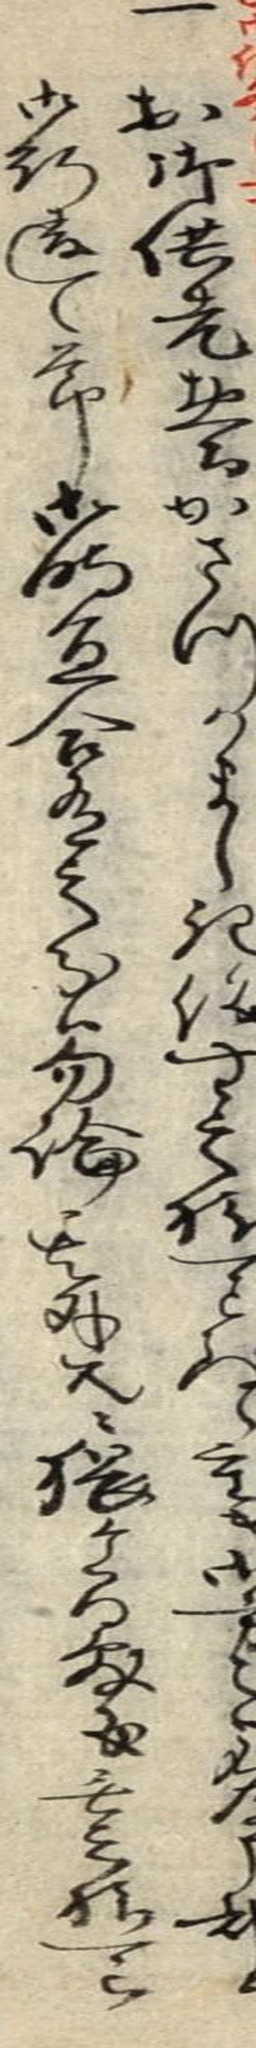御行違之節御時宜合有之分は勿論其外共に猥ケ間敷義無之様可被
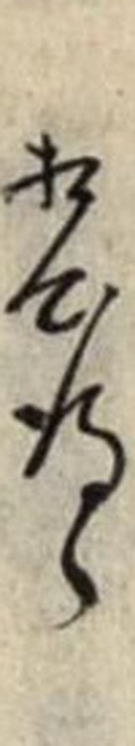相心得候
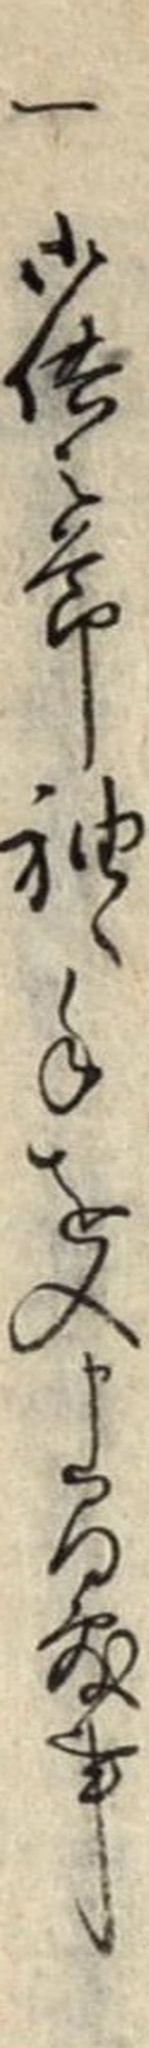一御供之節袖へ手を入申間敷事
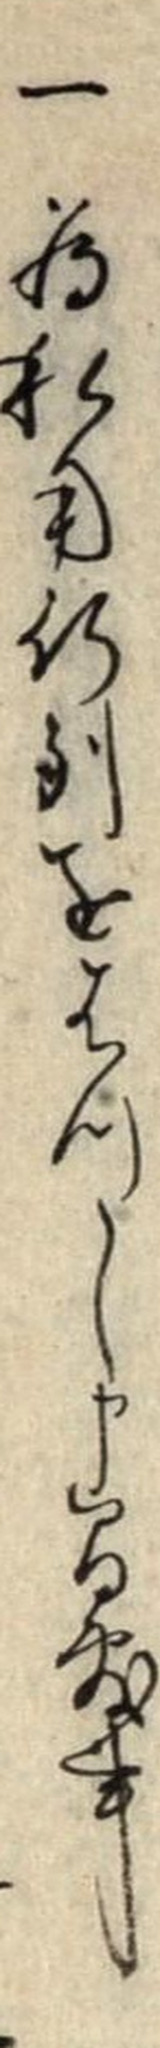一為私用行列をはつし申間敷事

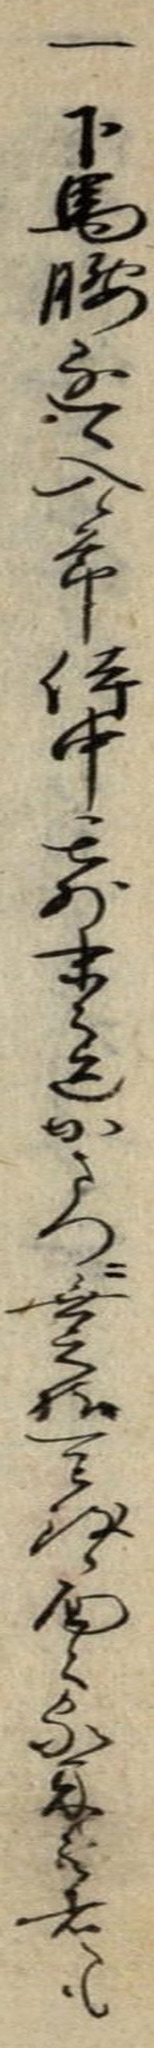一下馬腰懸へ入候節侍中其外末々迄かさつに無之様可被致候面々家来之者へも
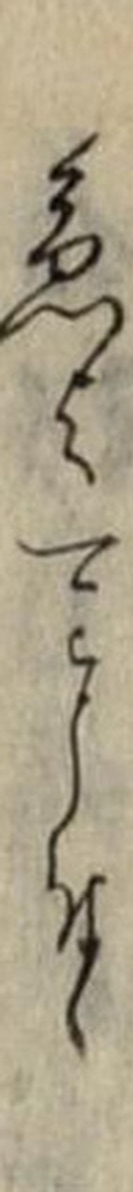急と可被申付候
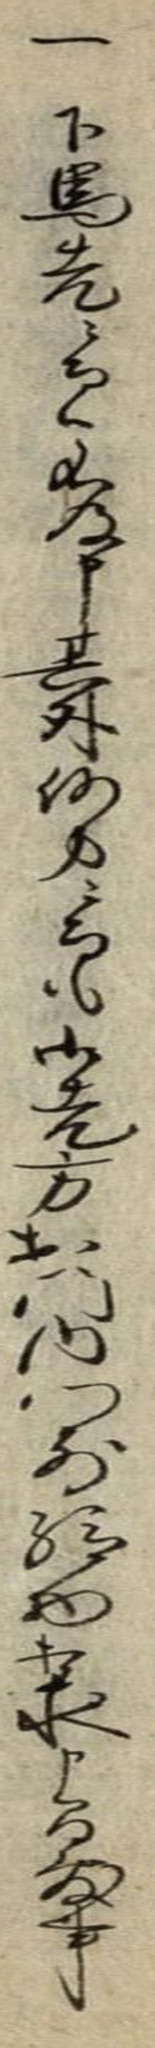一下馬先にては不及申其外何方にても御先方御門内門前給物相求申間敷事
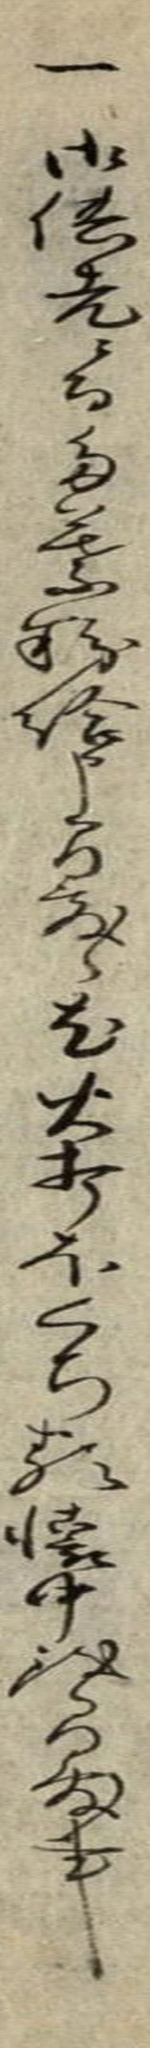一御供先にて多葉粉給申間敷候尤火打ほくち類懐中致間敷事
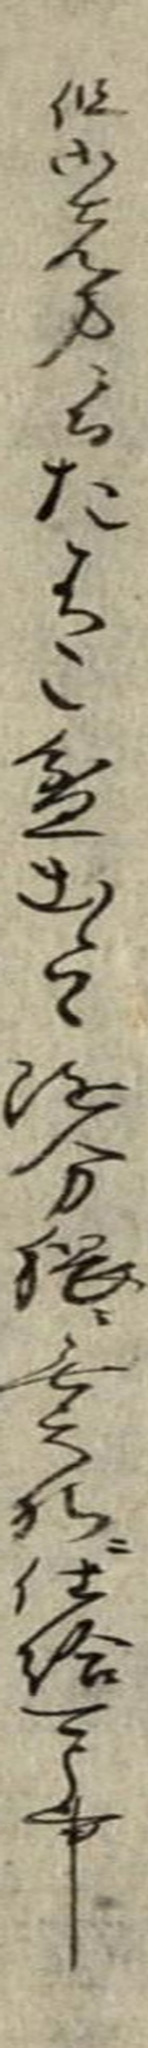但御先方にてたはこ盆出候はゝ随分猥に無之様に仕給可申事
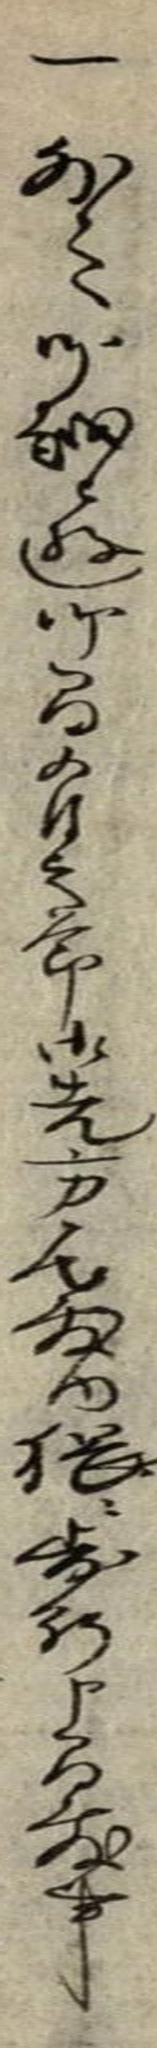一外々御越被遊御間有之節御先方屋敷内猥に歩行申間敷事
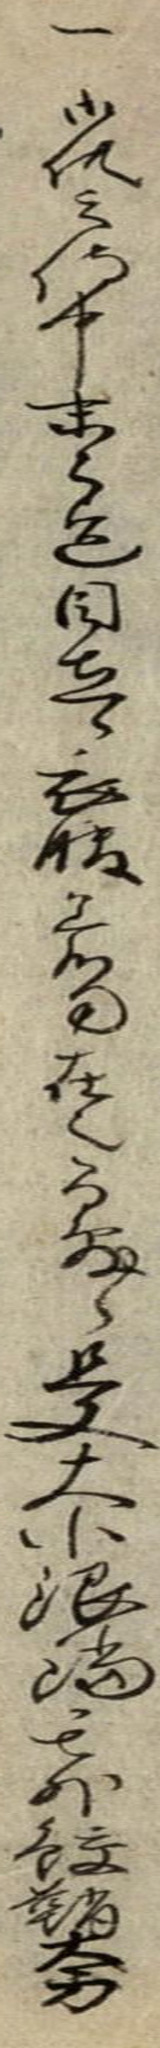一御供之侍中末々迄目立候衣服着用在之間敷候且又大小銀鐺其外鮫鞘太刀
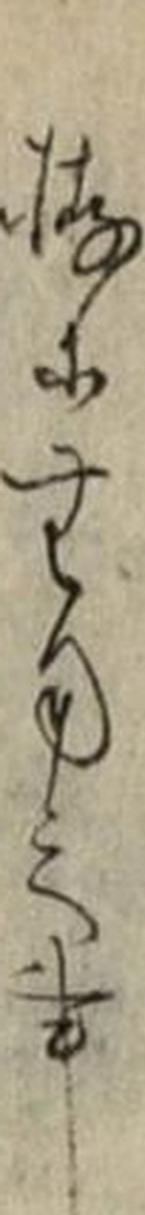拵等無用之事
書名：三都并道中之部
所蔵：福井県文書館 Fukui Prefectural Archives
